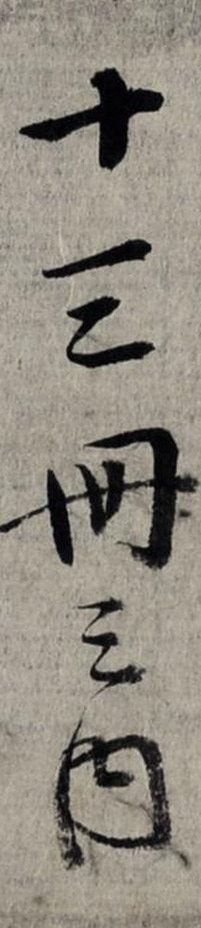十三冊之内

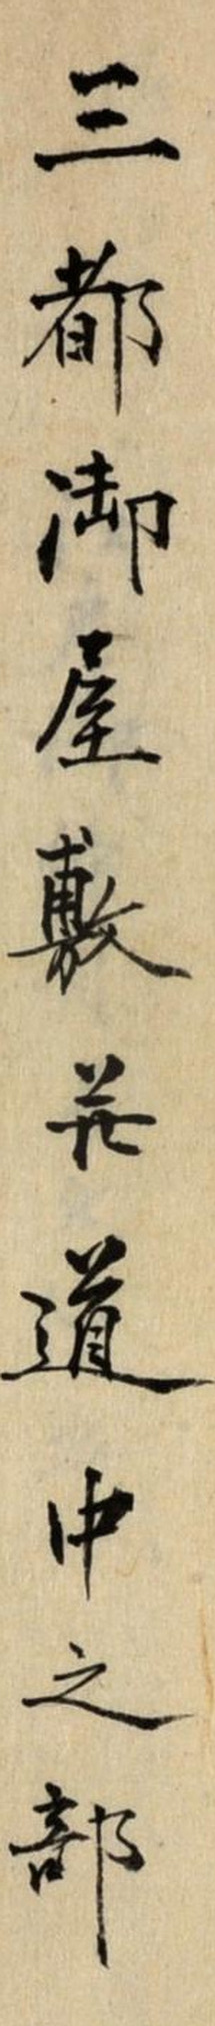三都御屋敷幷道中之部
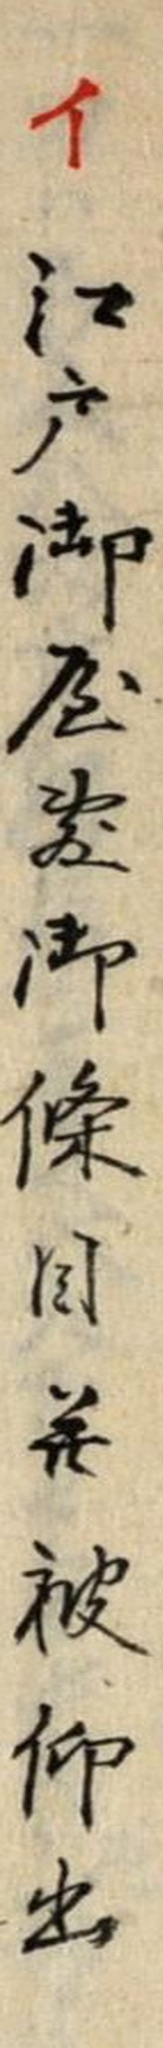イ江戸御屋敷御條目幷被仰出
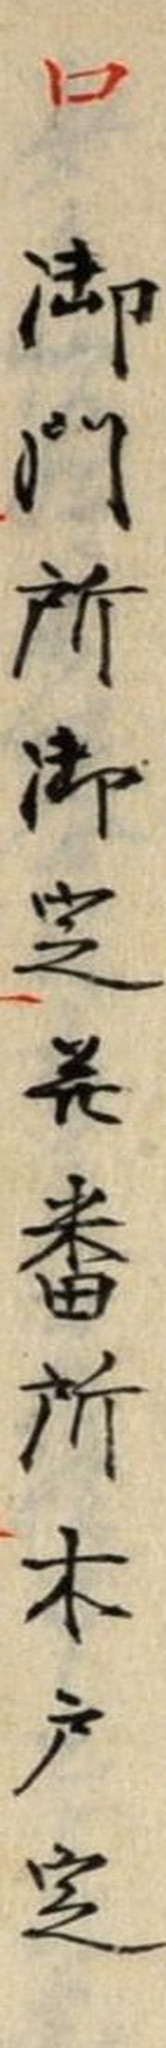ロ御門所御定幷番所木戸定
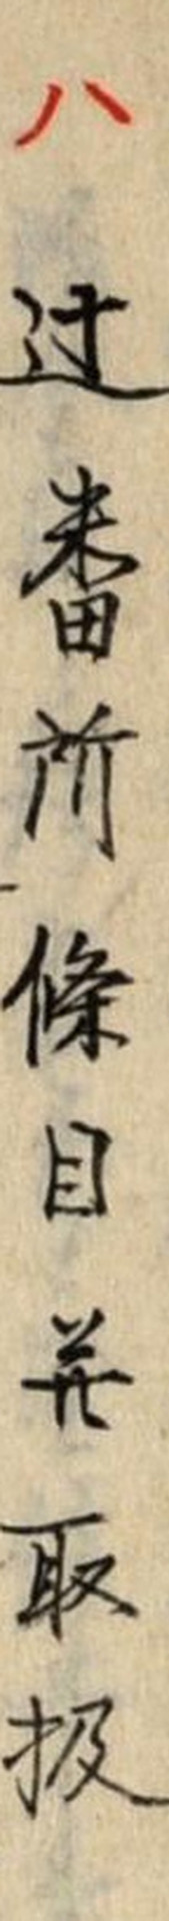ハ辻番所條目條幷取扱
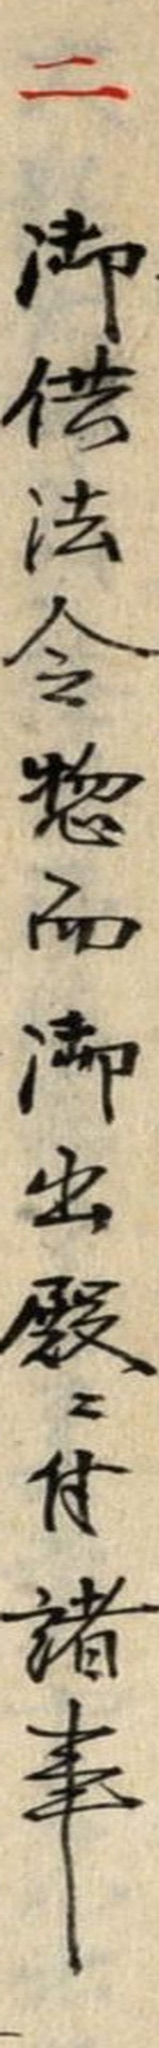ニ御供法令惣而御出殿に付諸事
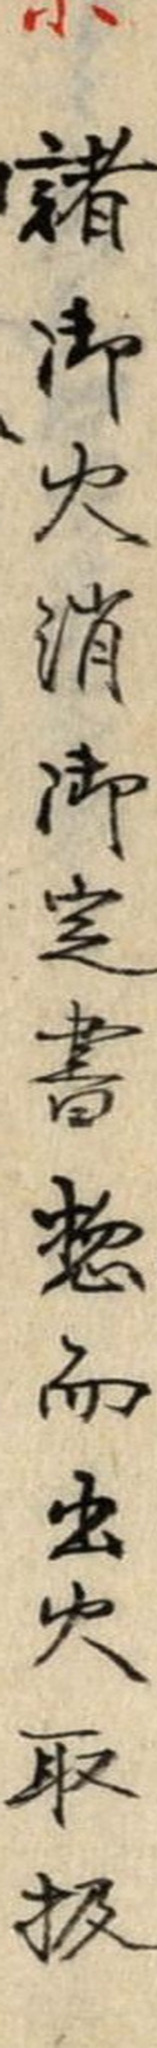ホ諸御火消御定書惣て出火取扱
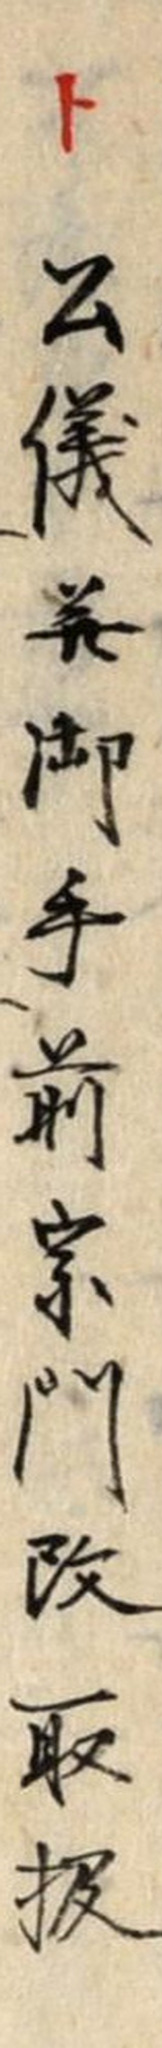ト公儀幷御手前宗門改取扱
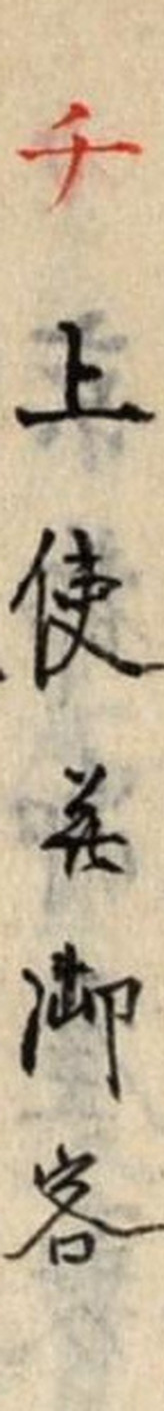チ上使幷御客
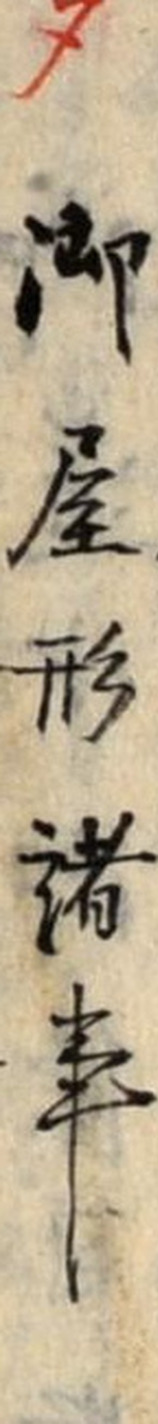ヌ御屋形諸事

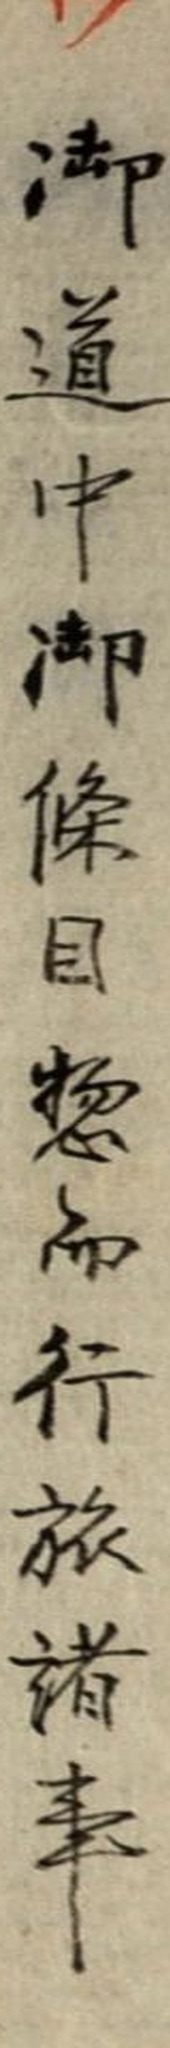ワ御道中御條目惣て行旅諸事
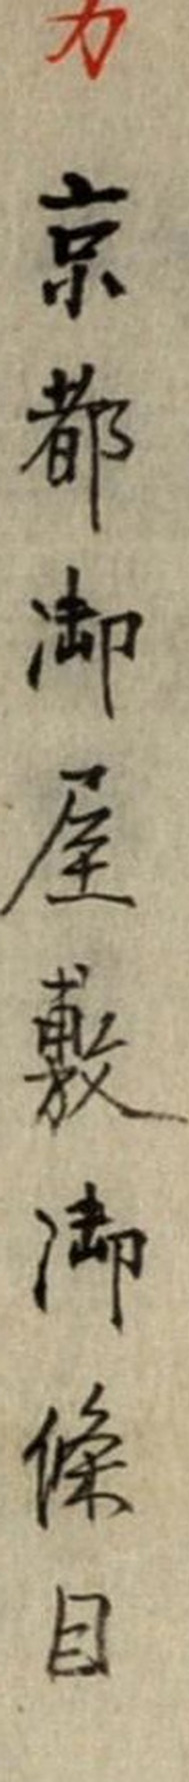カ京都御屋敷御條目
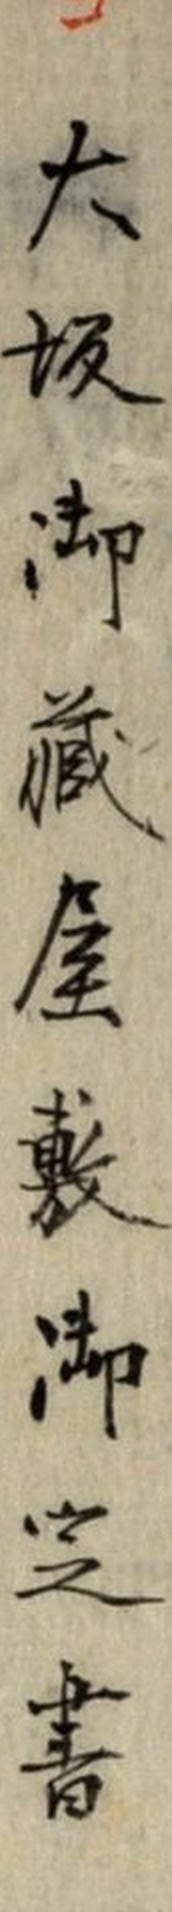ヨ大坂御蔵屋敷御定書
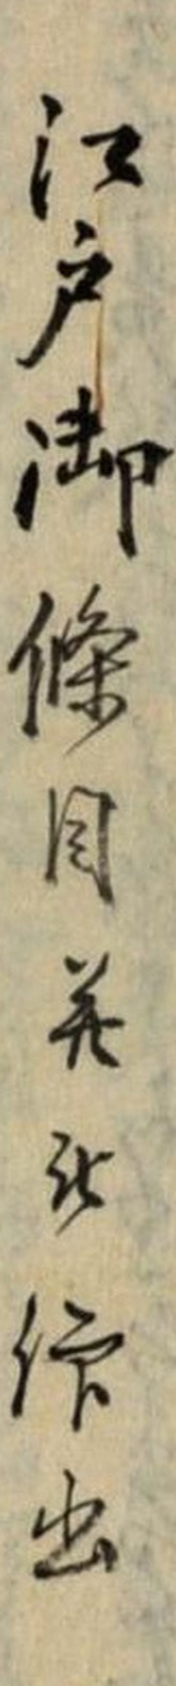江戸御條目幷被仰出
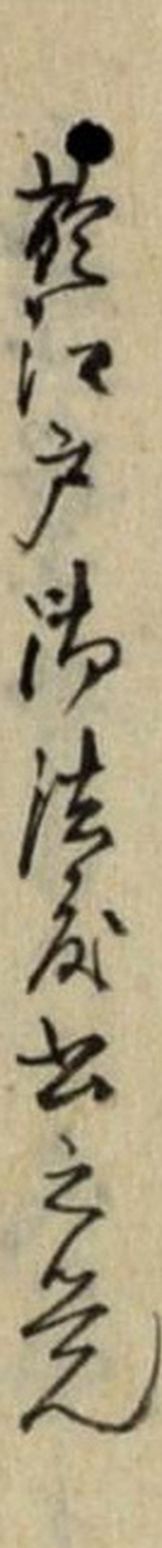於江戸御法度書之御覚
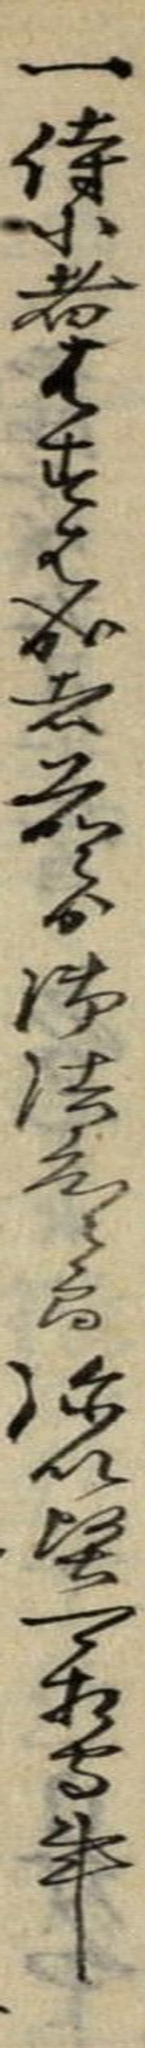一侍小者はすは成者前々ゟ御法度に候間弥以堅可相守事
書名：三都并道中之部
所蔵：福井県文書館 Fukui Prefectural Archives
